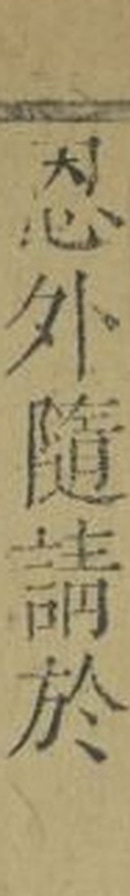恩外隨請於
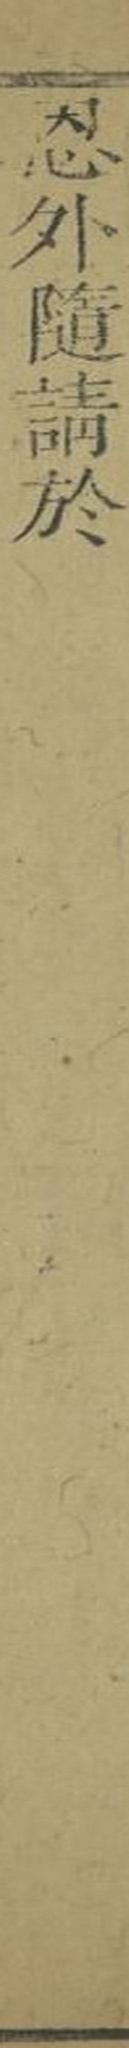恩外隨請於
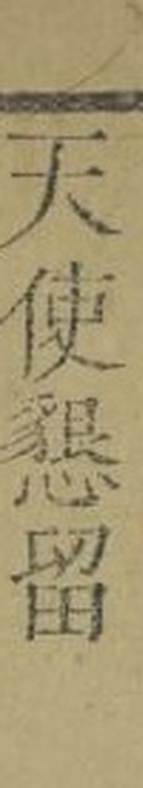天使懇留
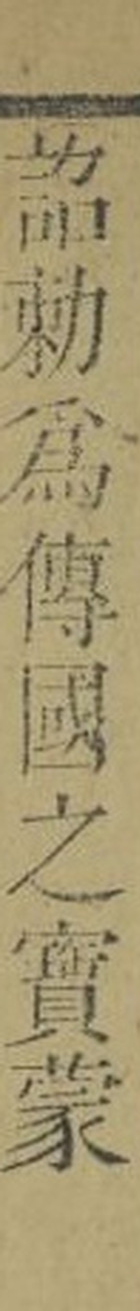詔勅爲傳國之寶蒙
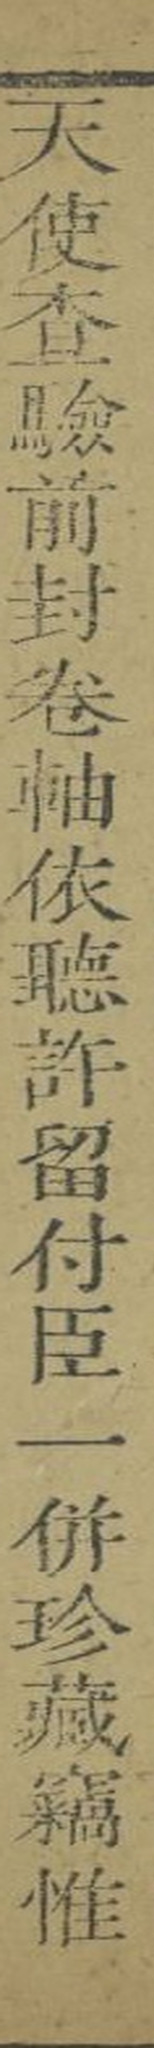天使査驗前封卷軸依聽許留付臣一併珍藏竊惟
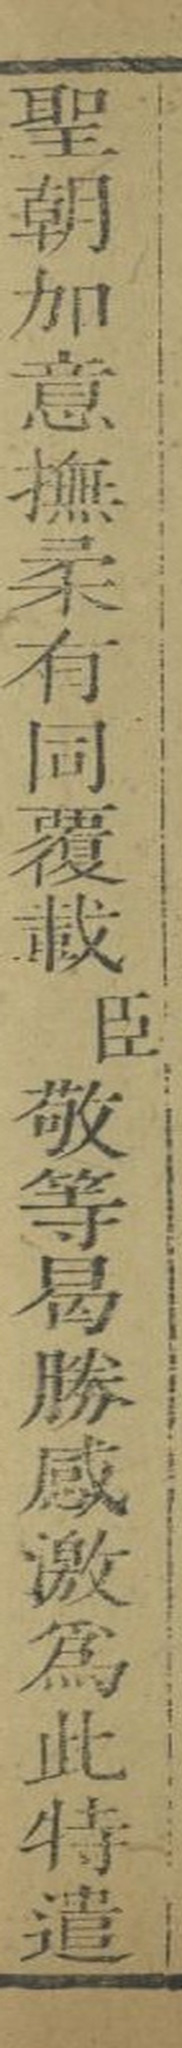聖朝加意撫柔有同覆載臣敬等曷勝感激爲此特遣
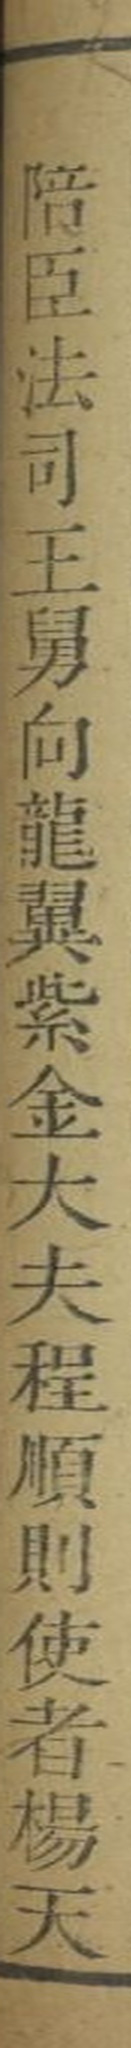陪臣法司王舅向龍翼紫金大夫程順則使者楊天
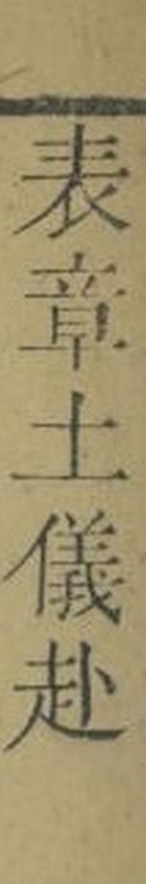表章土儀赴
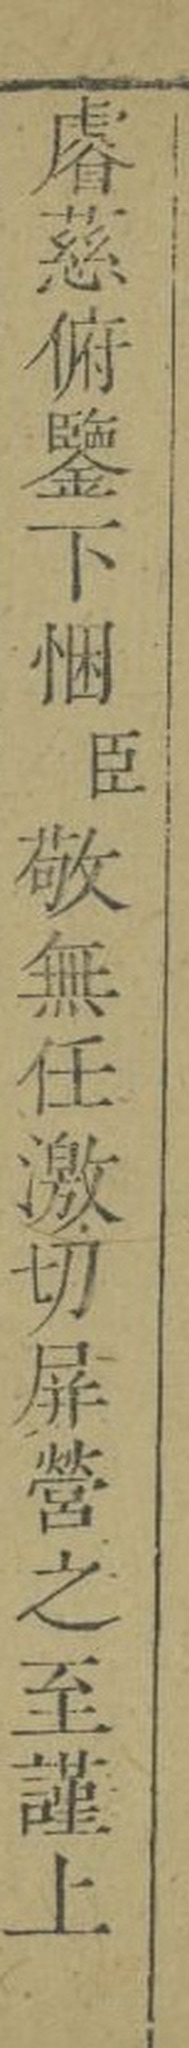睿慈俯鑒下悃臣敬無任激切屏營之至謹上

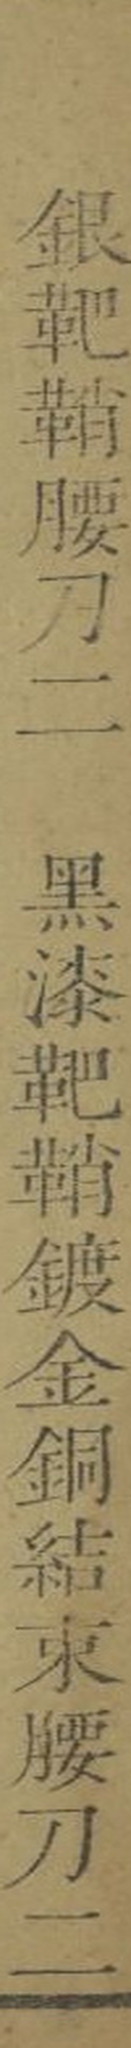銀靶鞘腰刀二黑漆靶鞘鍍金銅結束腰刀二
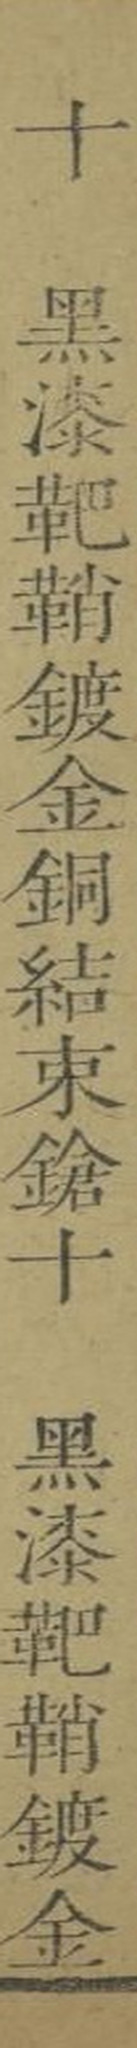十黑漆靶鞘鍍金銅結束鎗十黑漆靶鞘鍍金
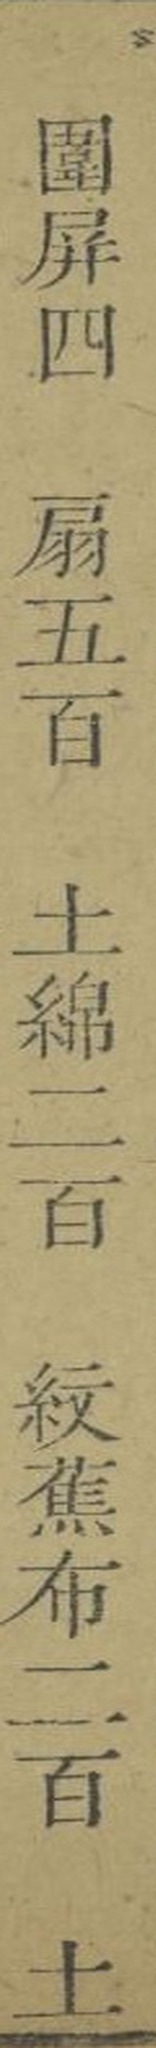圍屏四扇五百土綿二百紋蕉布二百土
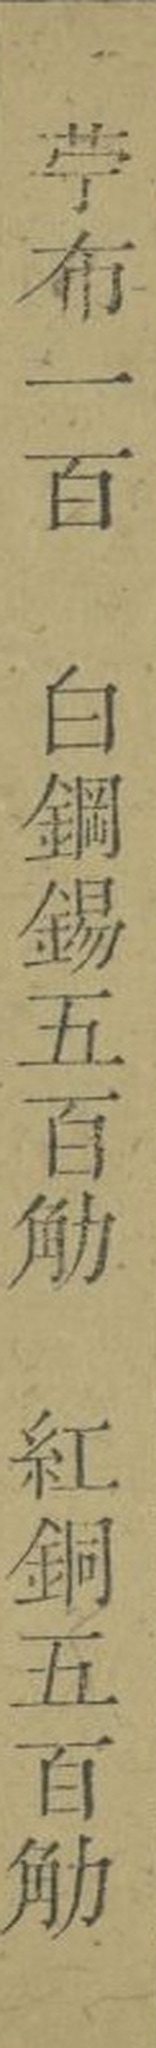苧布一百白鋼錫五百觔紅銅五百觔
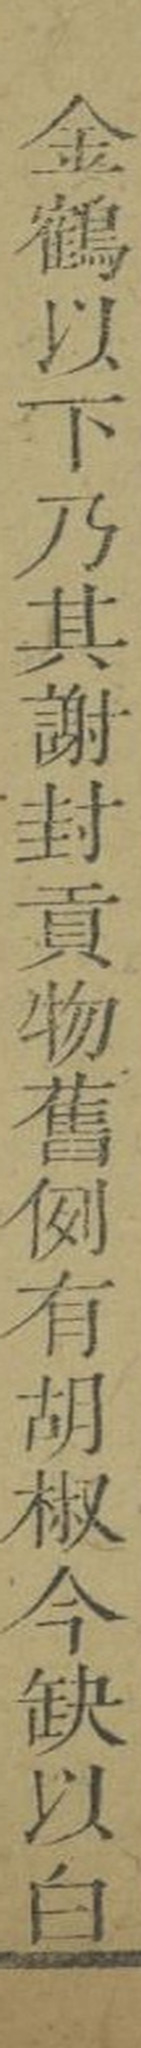金鶴以下乃其謝封貢物舊例有胡椒今缺以
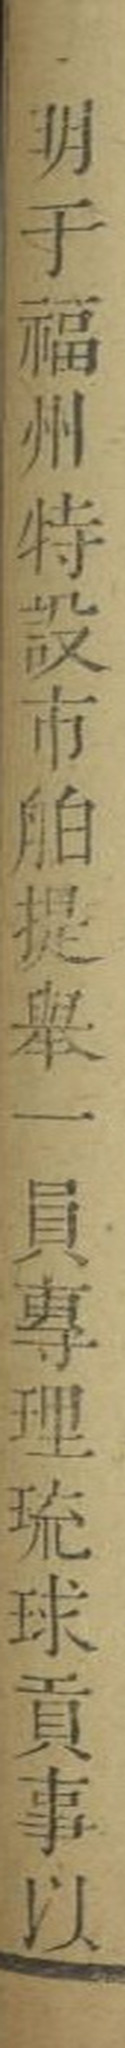明于福州特設市舶提舉一員專理琉球貢事以
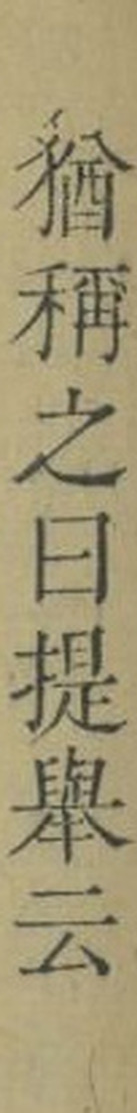猶稱之曰提舉云
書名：中山伝信録 巻二
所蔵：University of the Ryukyus Library
